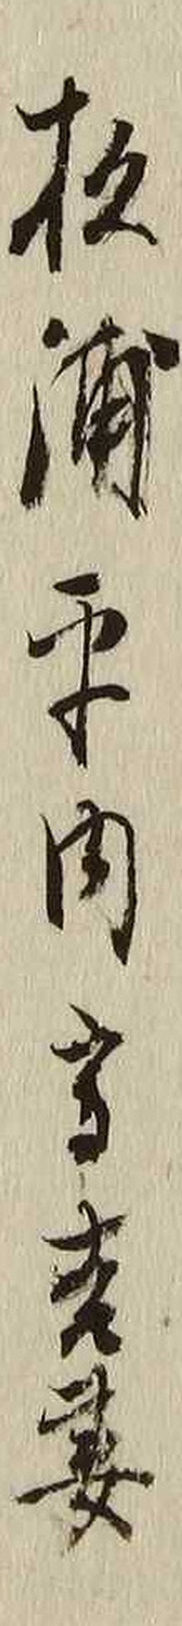女杉浦平内高吉妻
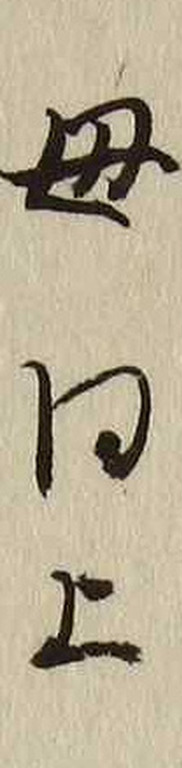母同上
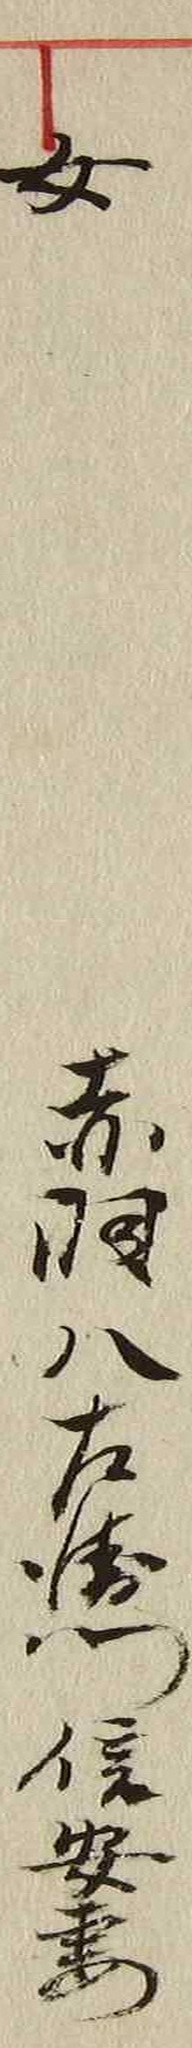女赤羽八左衛門信安妻
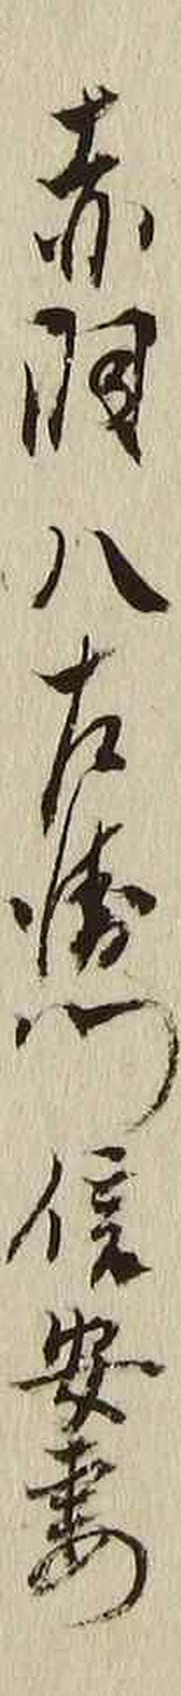女赤羽八左衛門信安妻
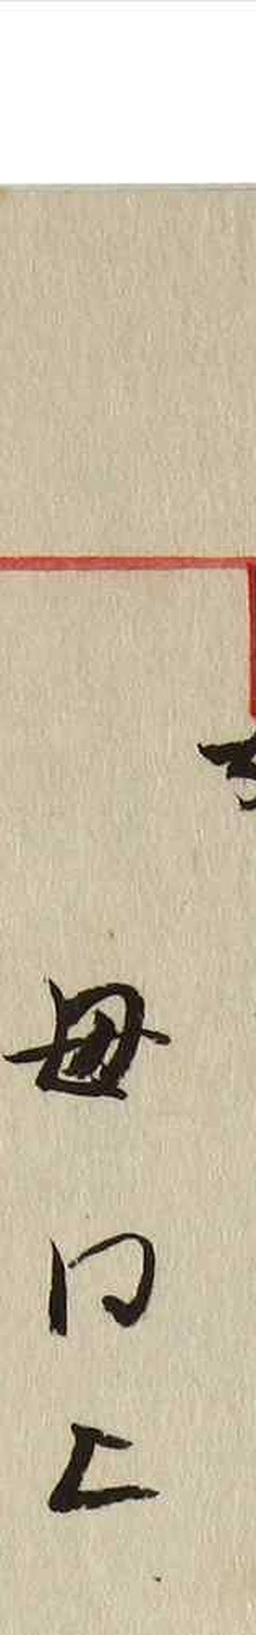母同上
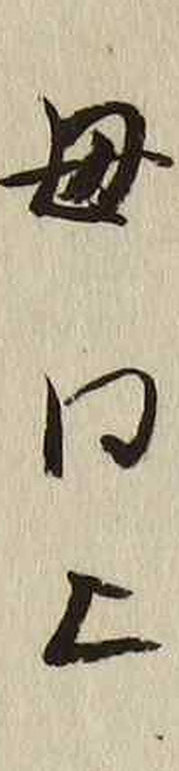母同上
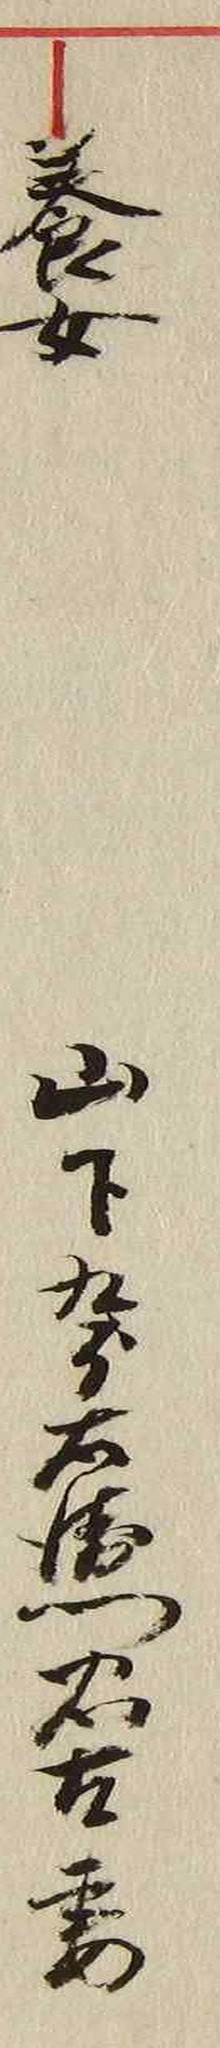養女山下九郎右衛門忠古妻
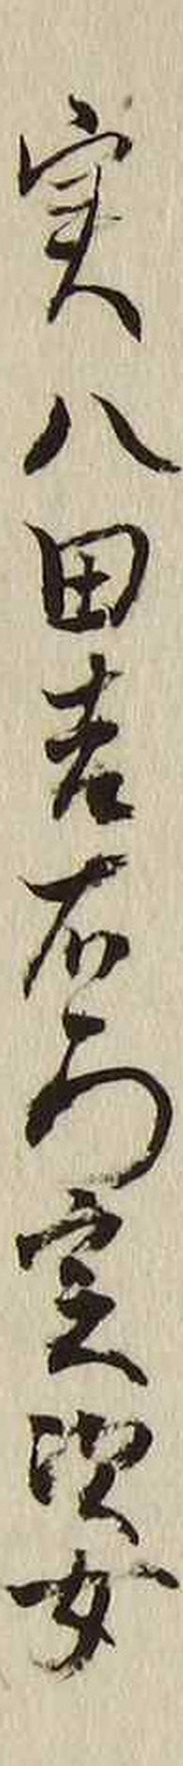実八田吉右衛門実次女
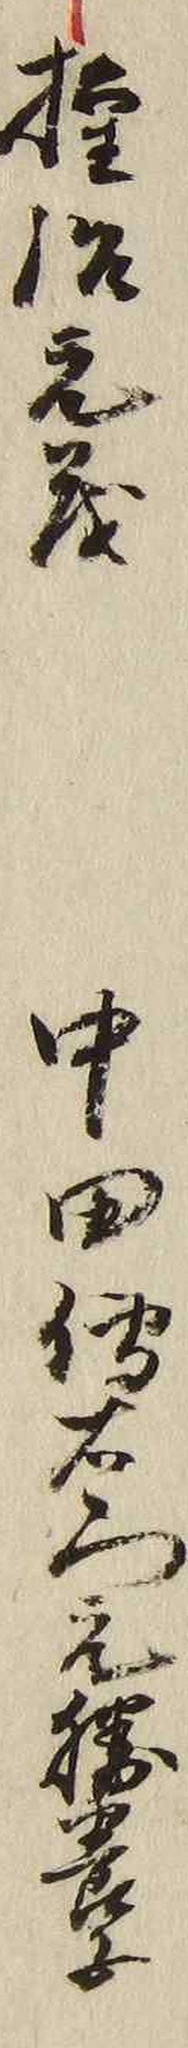権治元茂中田伝右衛門元勝養子

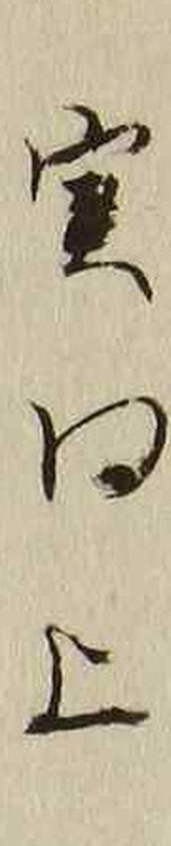実同上
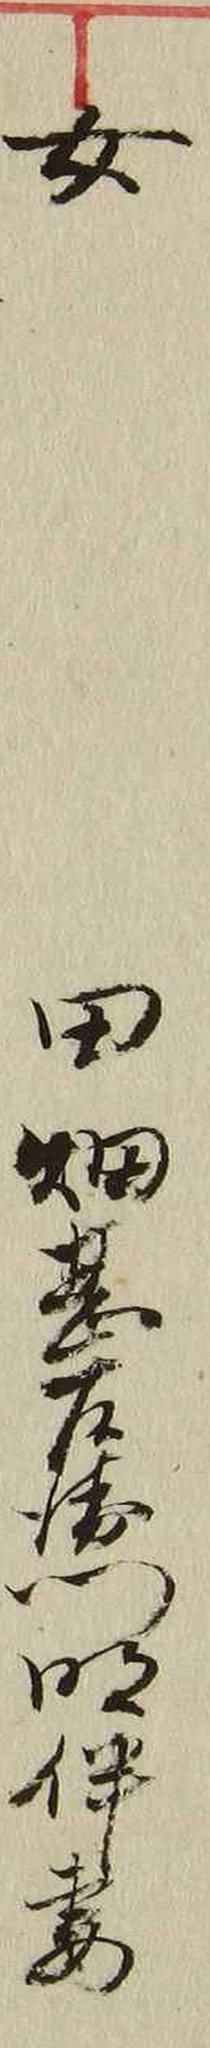女田畑甚左衛門明伴妻
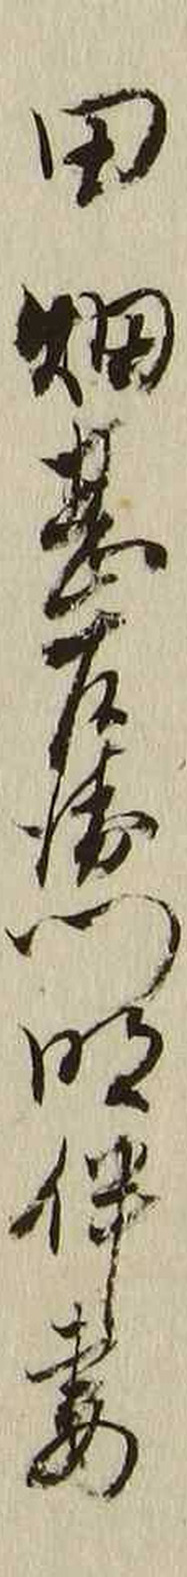女田畑甚左衛門明伴妻
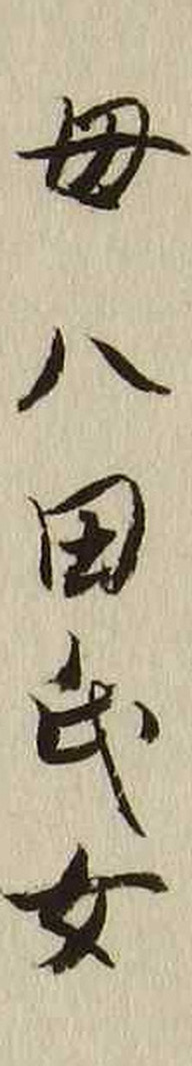母八田氏女
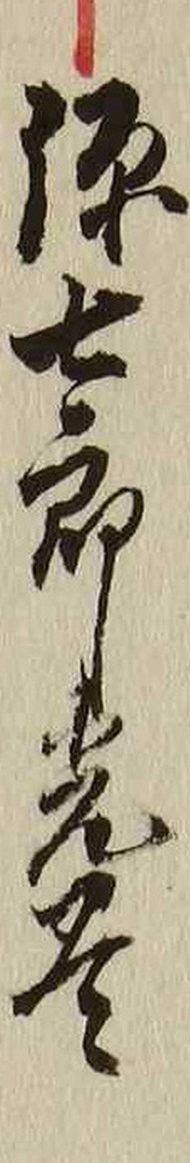源七郎光豊
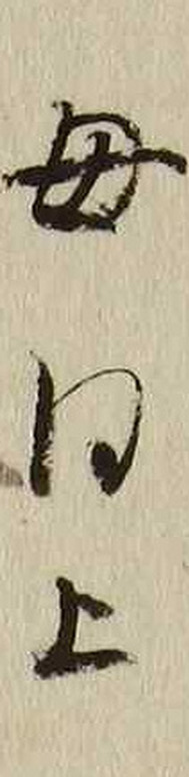実同上
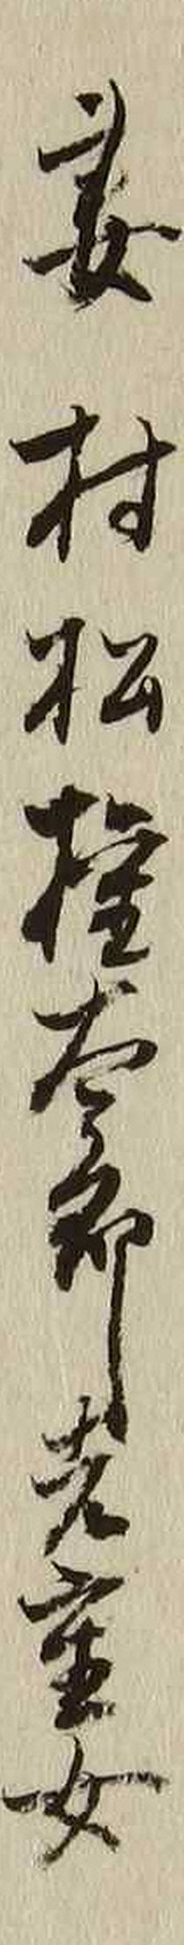妻村松権太郎吉重女
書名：諸士系譜　巻之349　も之部5
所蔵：会津若松市立会津図書館
